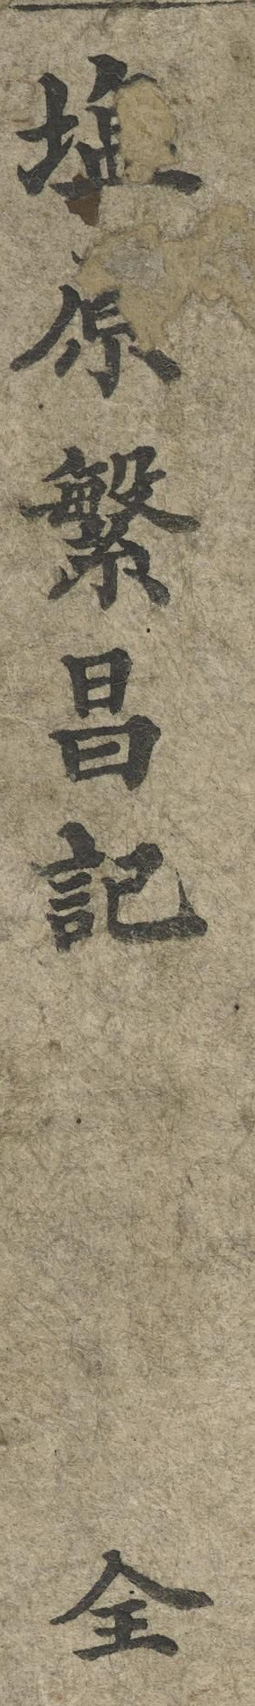塩原繁昌記全

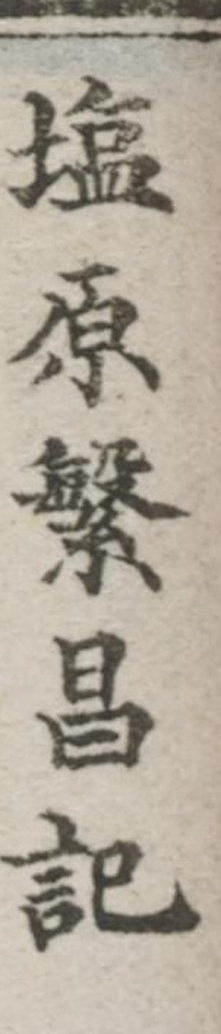塩原繁昌記
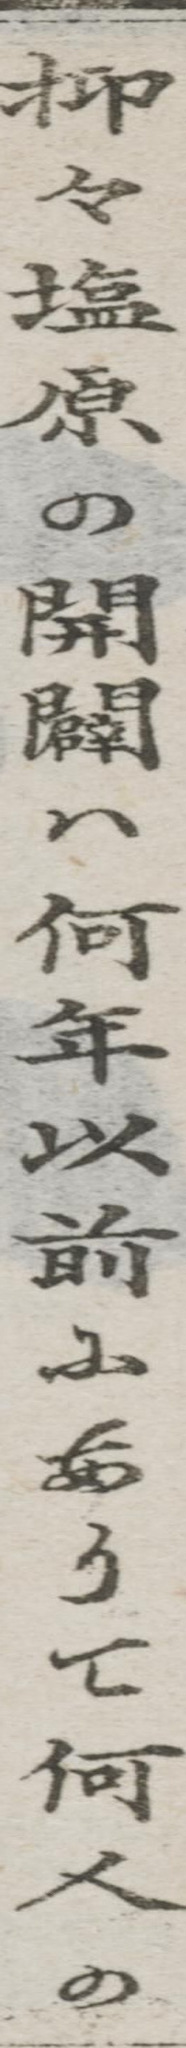抑々塩原の開闢は何年以前にありて何人の
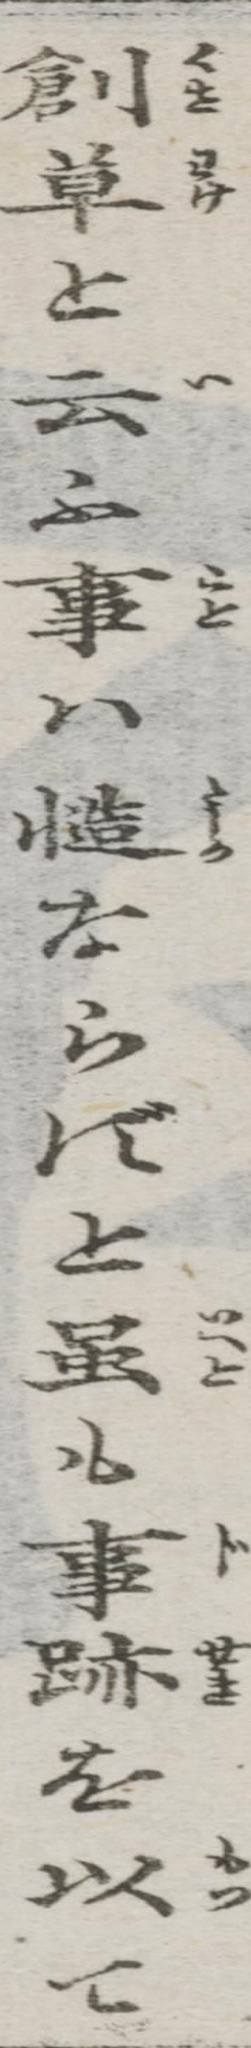創草と云ふ事は慥ならずと雖も事跡を以て
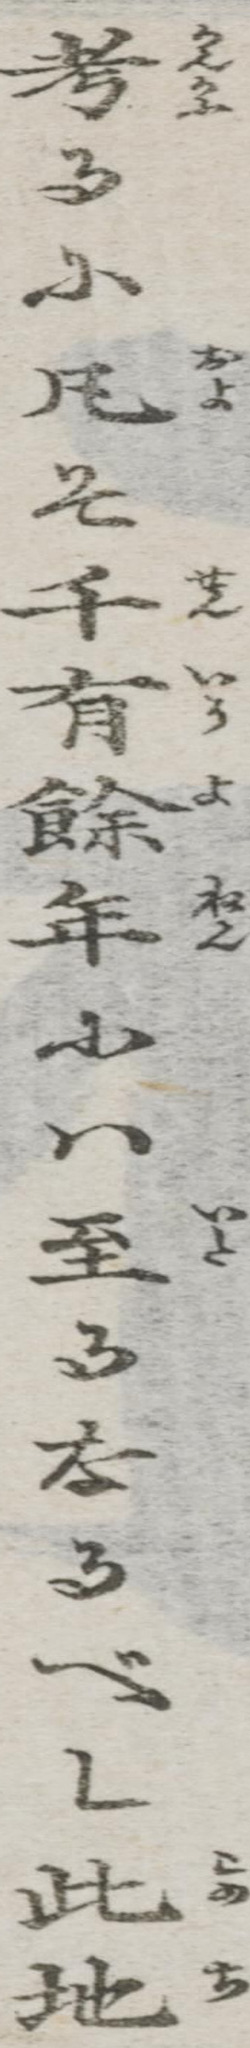考るに凡そ千有余年には至るなるべし此地
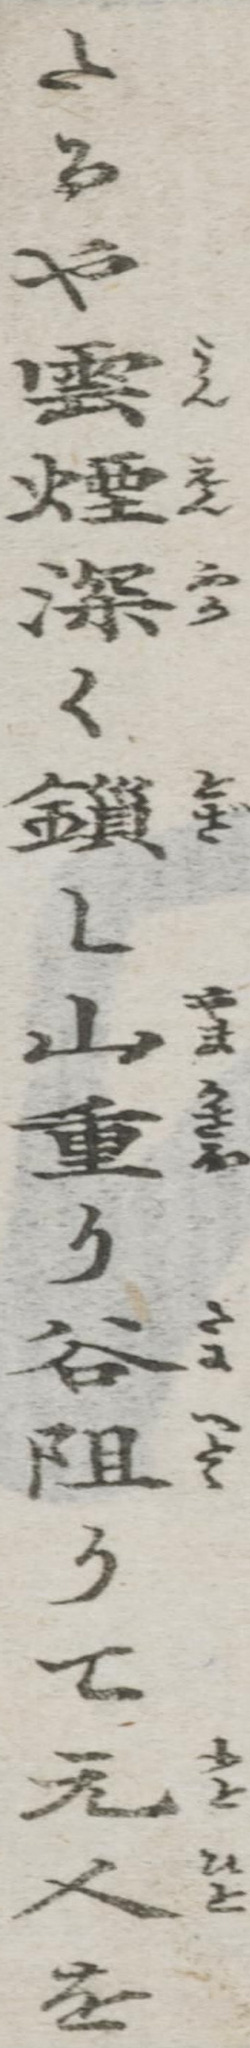たるや雲煙深く鎖し山重り谷阻りて元人を
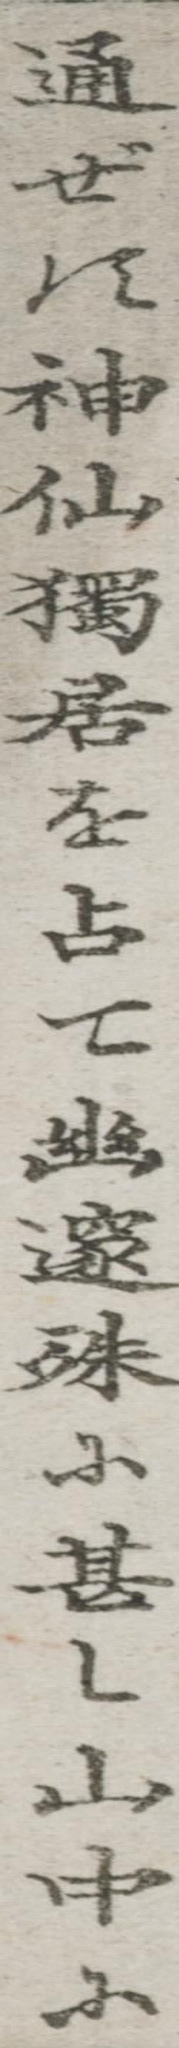通ぜす神仙独居を占て幽邃殊に甚し山中に
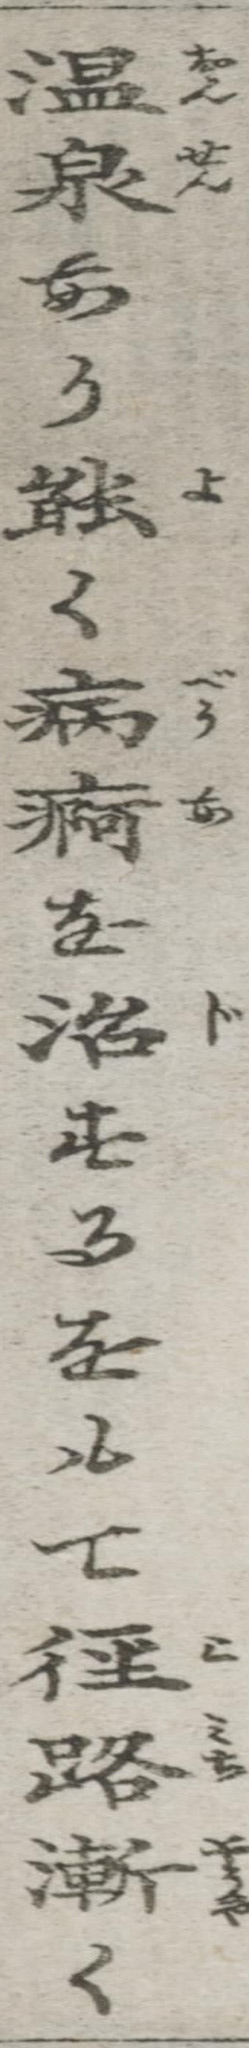温泉あり能く病痾を治するをもて径路漸く

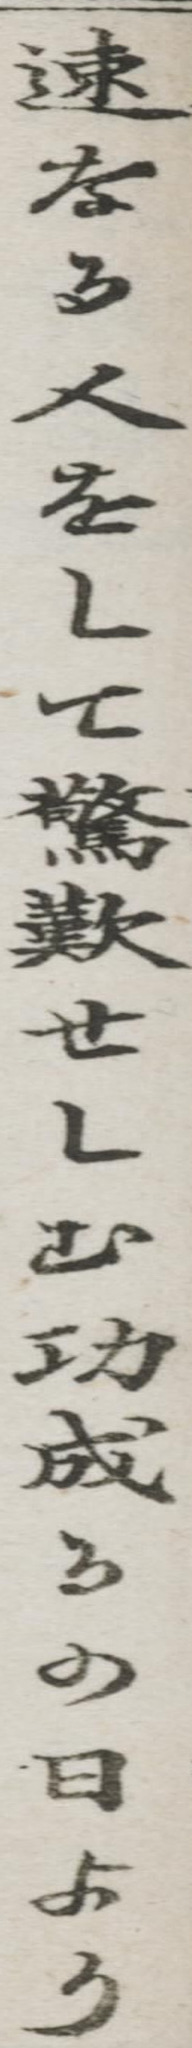速なる人をして驚嘆せしむ功成るの日より
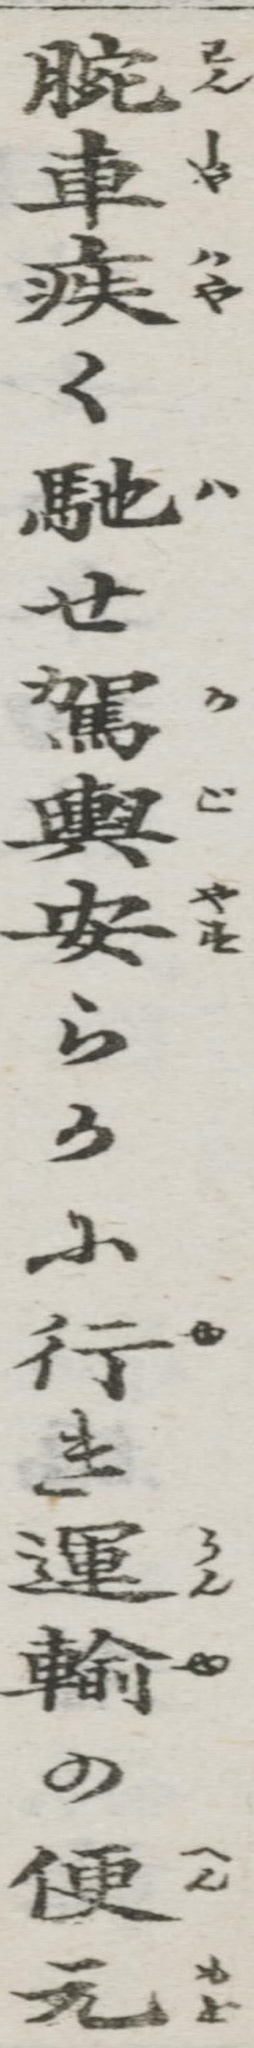腕車疾く馳せ駕輿安らかに行き運輸の便元
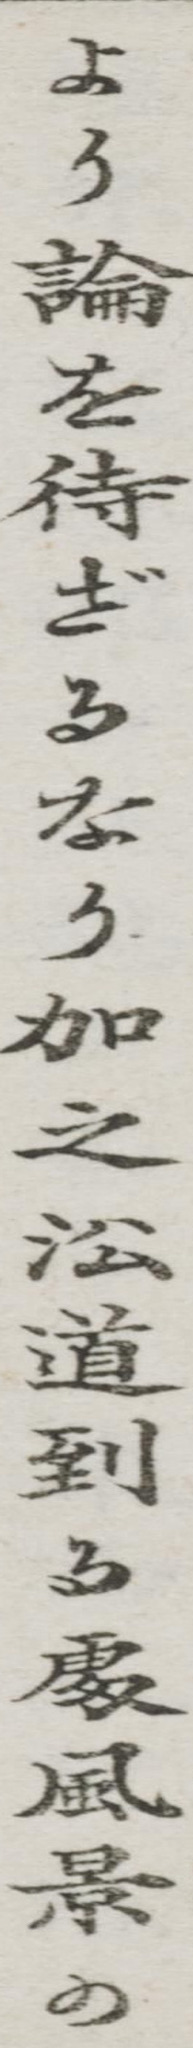より論を待ざるなり加之沿道到る処風景の
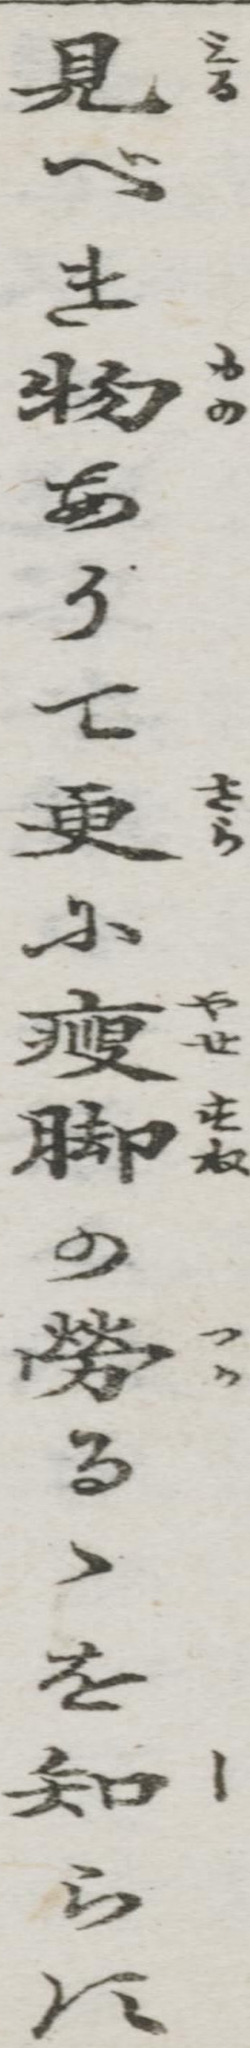見べき物ありて更に痩脚の労るゝを知らす
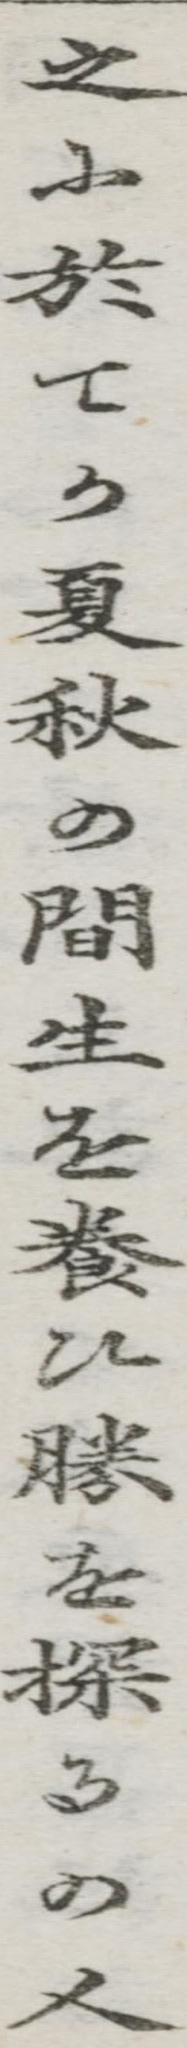之に於てか夏秋の間生を養ひ勝を探るの人
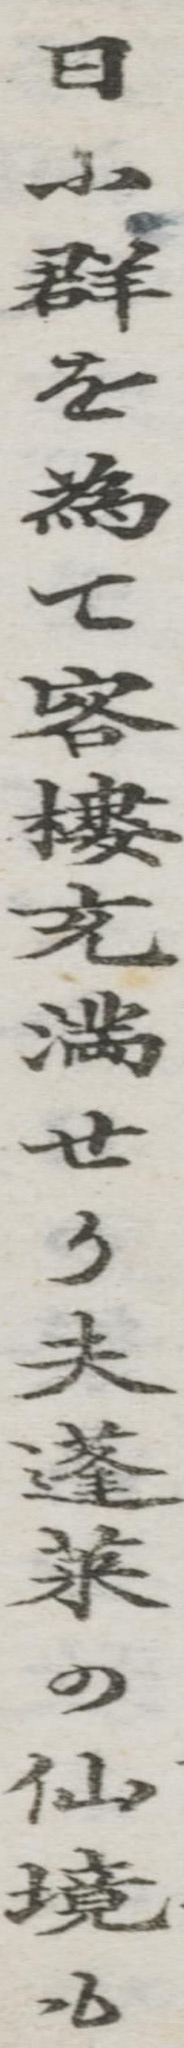日に群を為て客楼充満せり夫蓬莱の仙境も
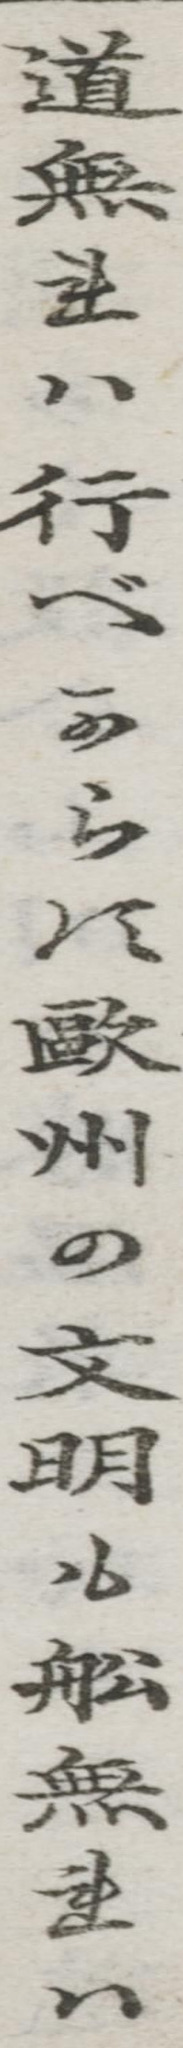道無れは行べからす欧州の文明も船無れは
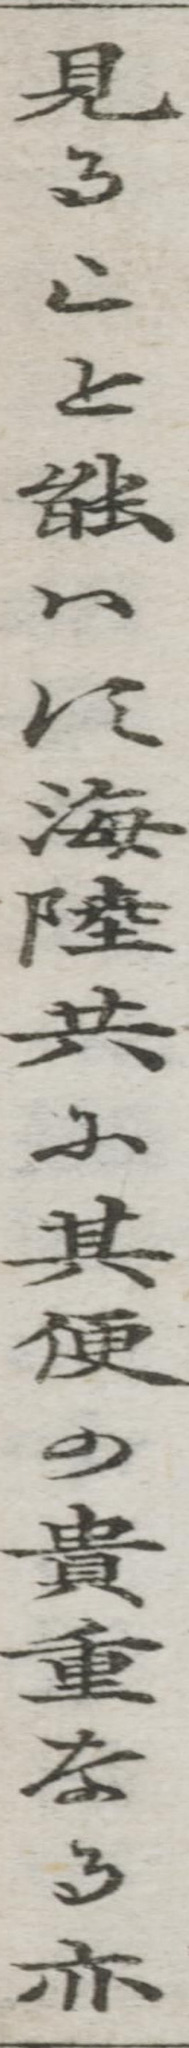見ること能はす海陸共に其便の貴重なる亦
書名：塩原繁昌記　全
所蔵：東京大学地震研究所図書室 Earthquake Research Institute Library, The University of Tokyo, JAPAN
